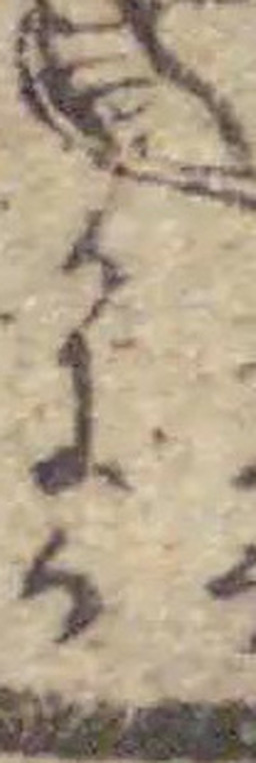かにか
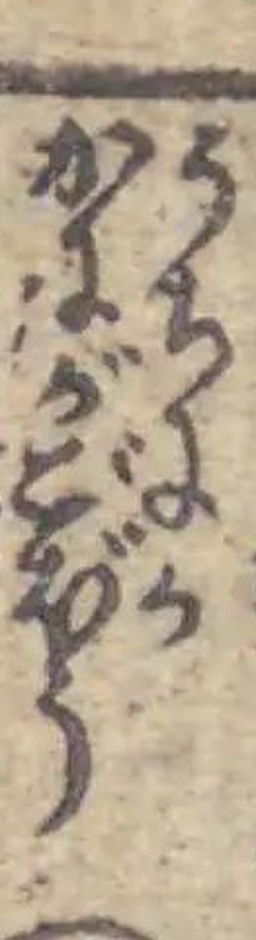かにがごぼう
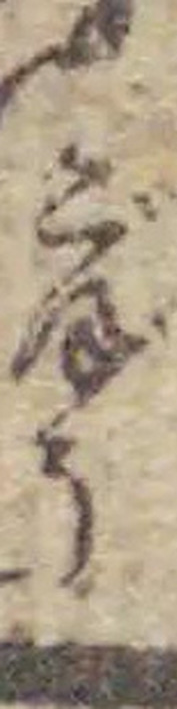ごぼう
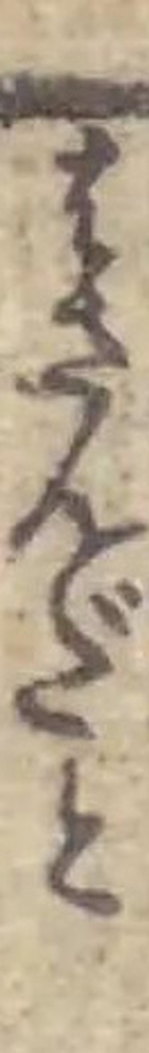はさんだと
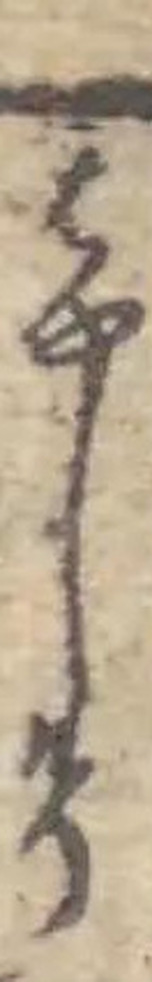はやしけり
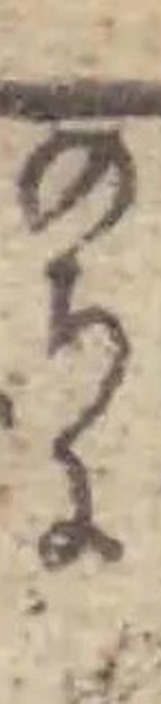のちに
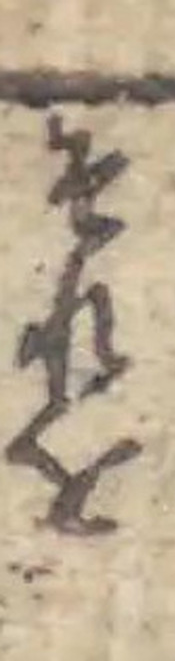それを
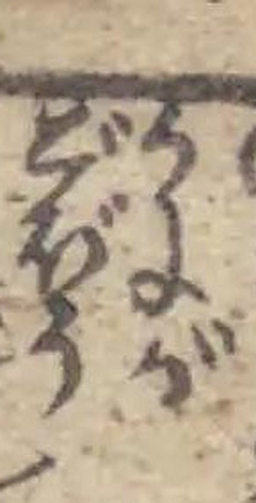ごぼう
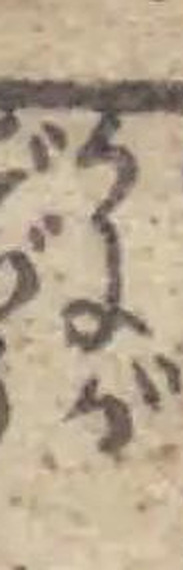かにが
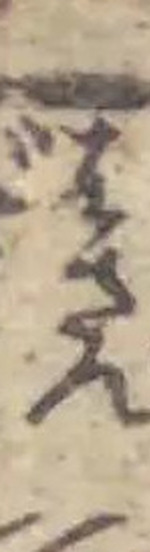はさん
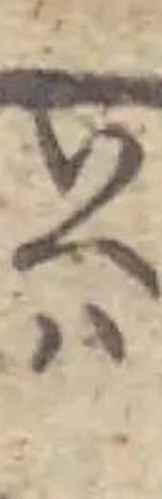いへは
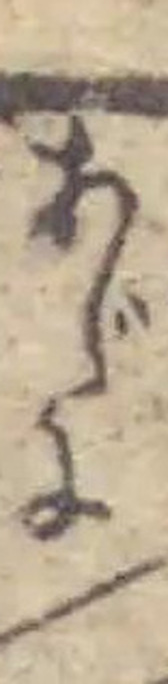あじに
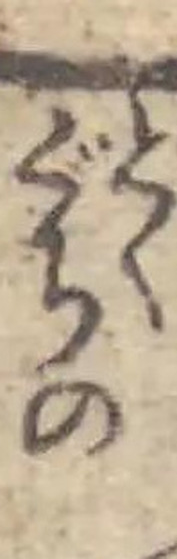ぐちの
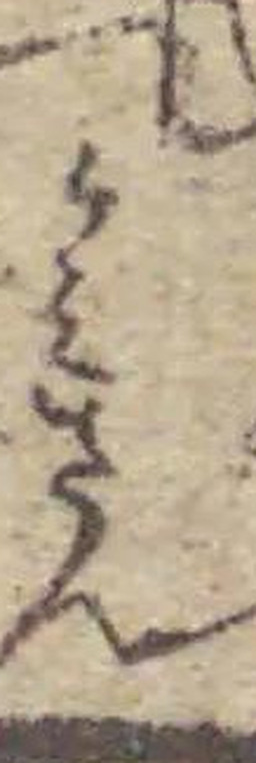かみさん
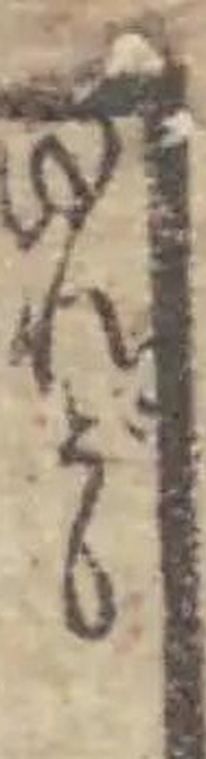ゆれども
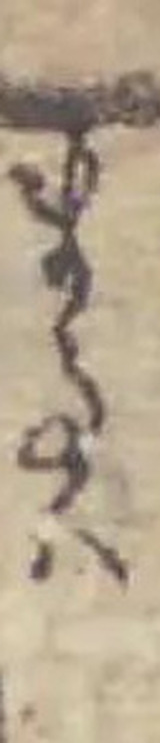ま事は
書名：蟹牛房挟多 3巻
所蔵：国立国会図書館 National Diet Library, JAPAN
